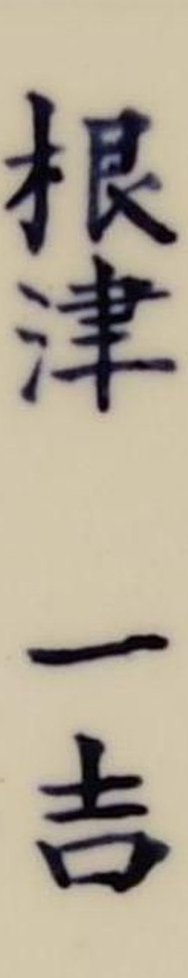根津一吉
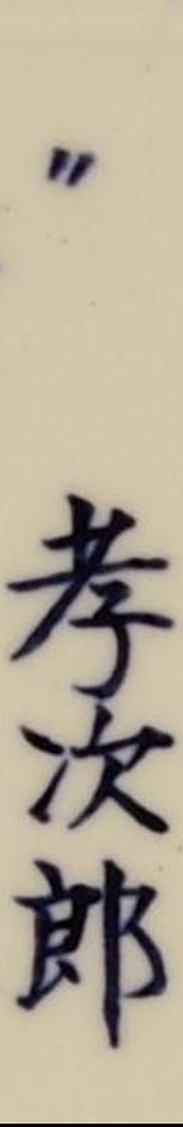孝次郎
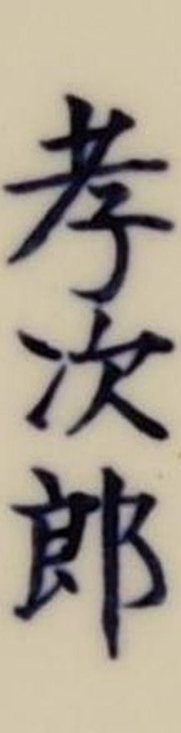孝次郎
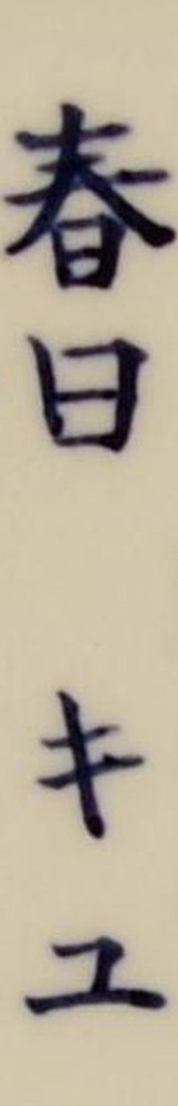春日キユ
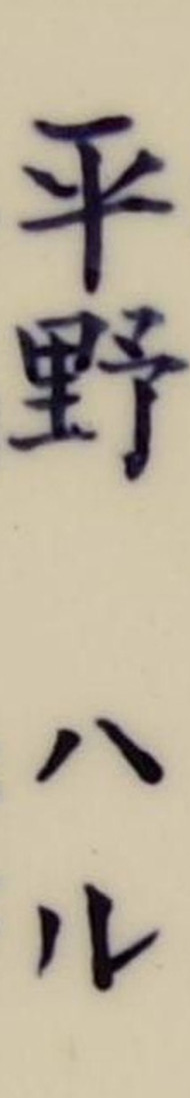平野ハル
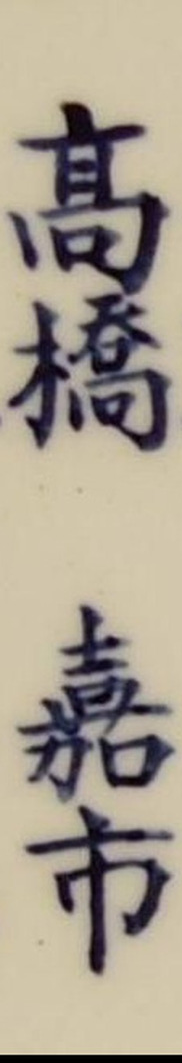高橋嘉市
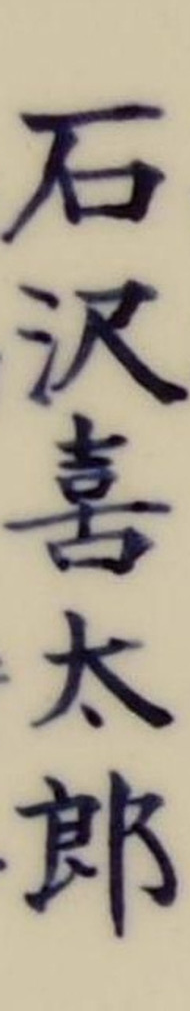石沢喜太郎
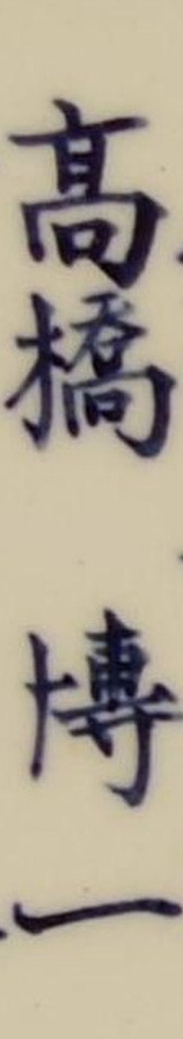高橋博一
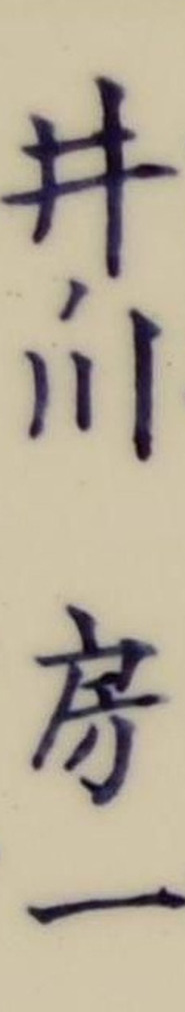井川房一

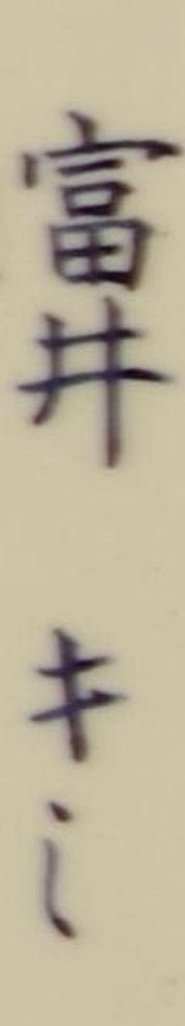富井キミ
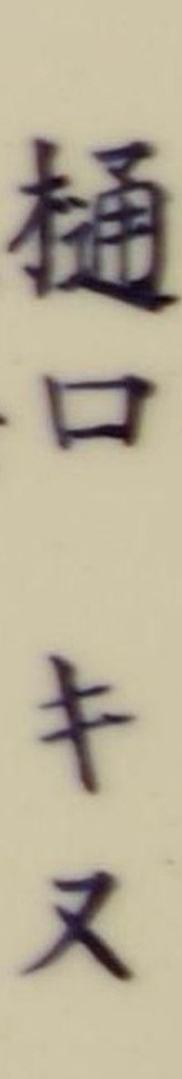樋口キ又
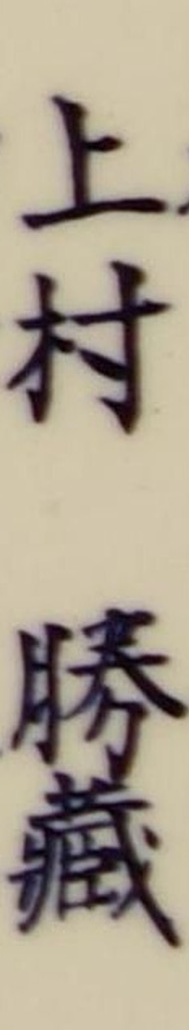上村勝蔵
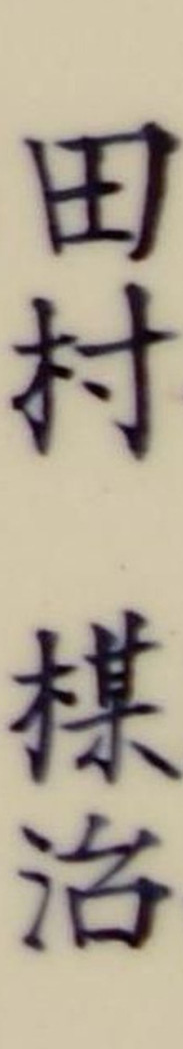田村楳治
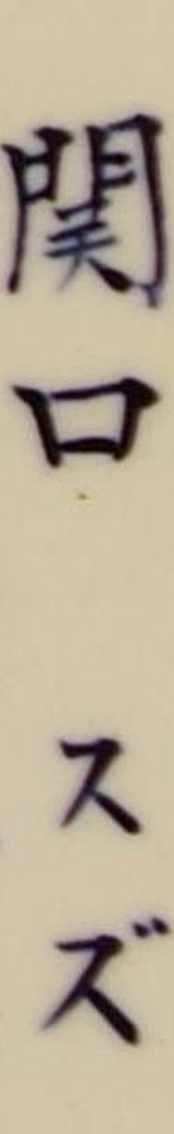関口スズ
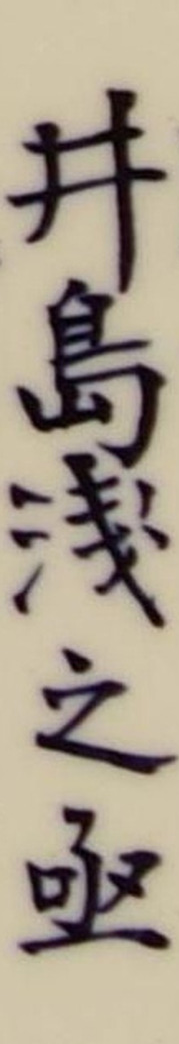井島浅之丞
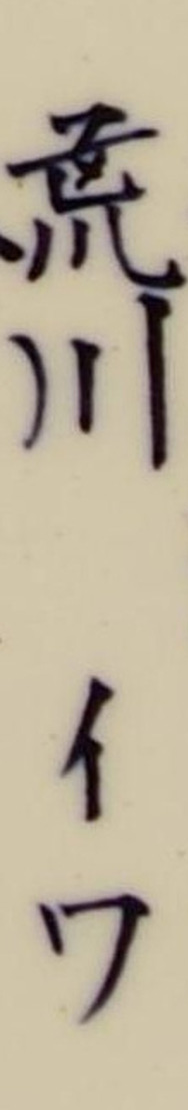荒川イワ
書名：E~L
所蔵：高野山金剛峯寺
